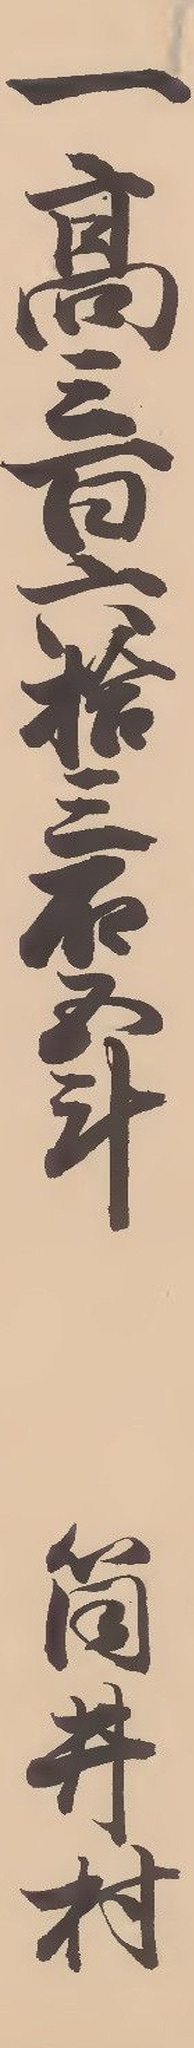一高三百六拾三石五斗筒井村
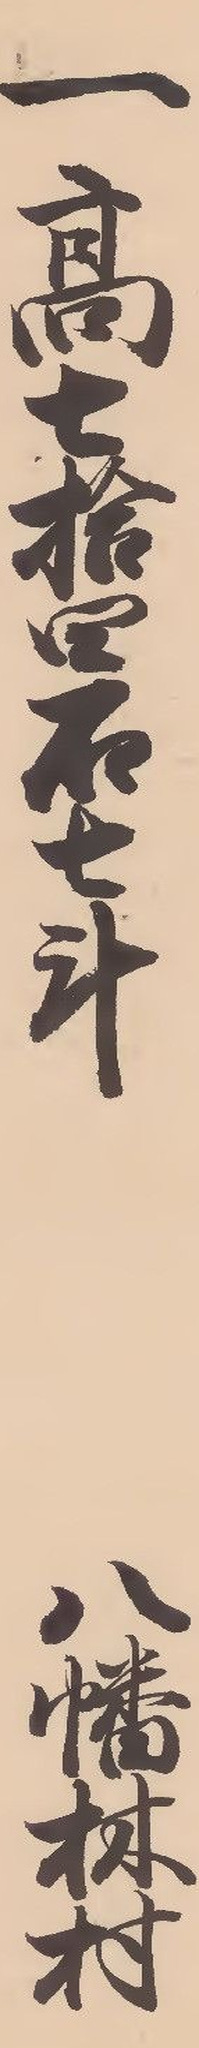一高七拾四石七斗八幡林村
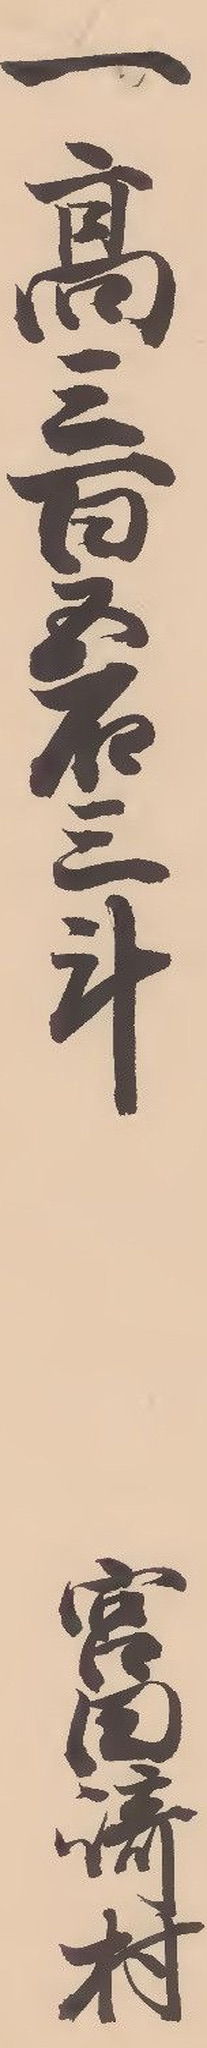一高三百五石三斗宮田崎村

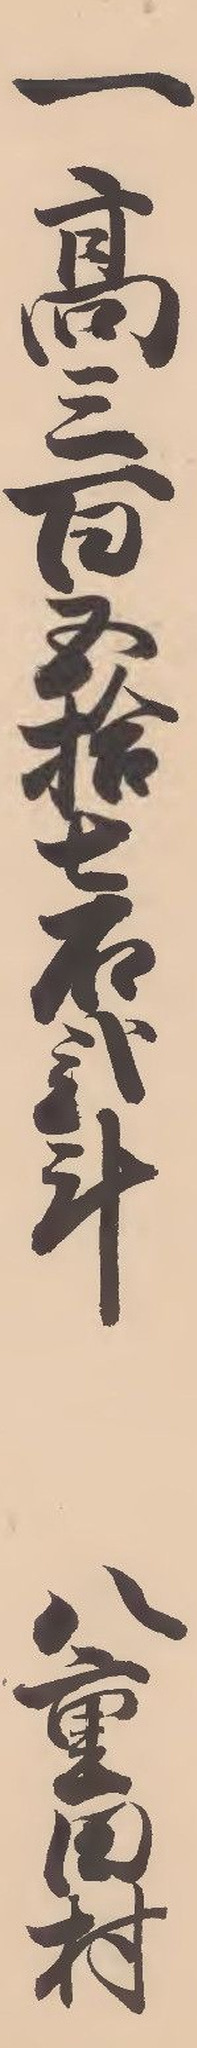一高三百五拾七石弐斗八重田村
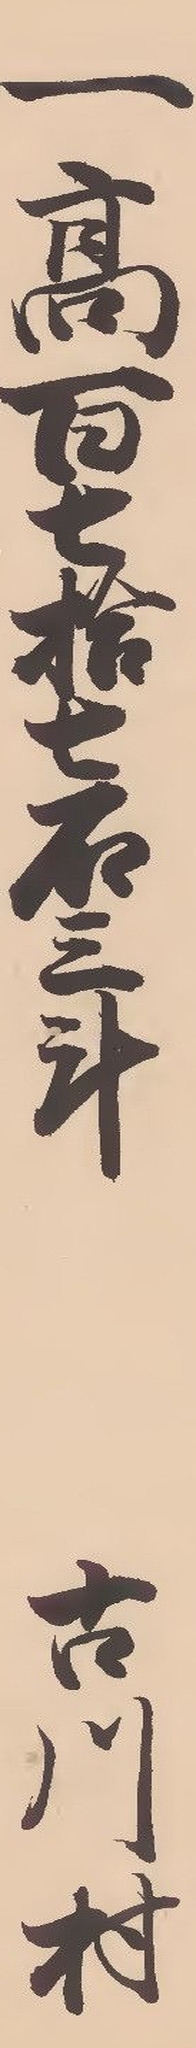一高百七拾七石三斗古川村
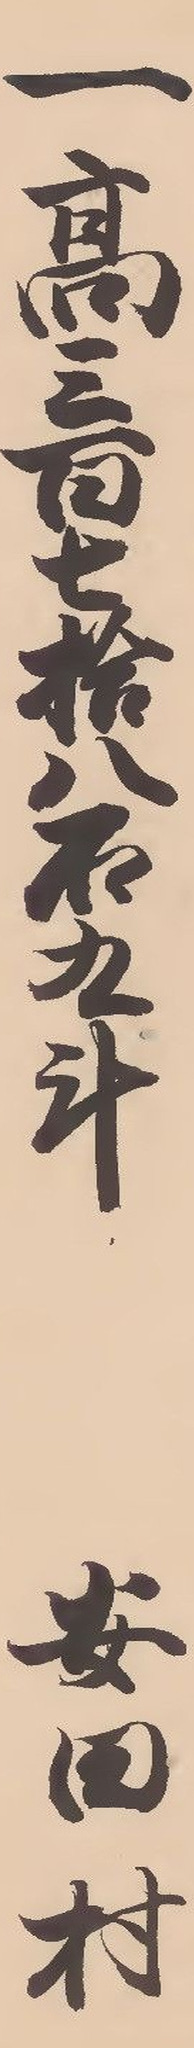一高三百七拾八石九斗安田村

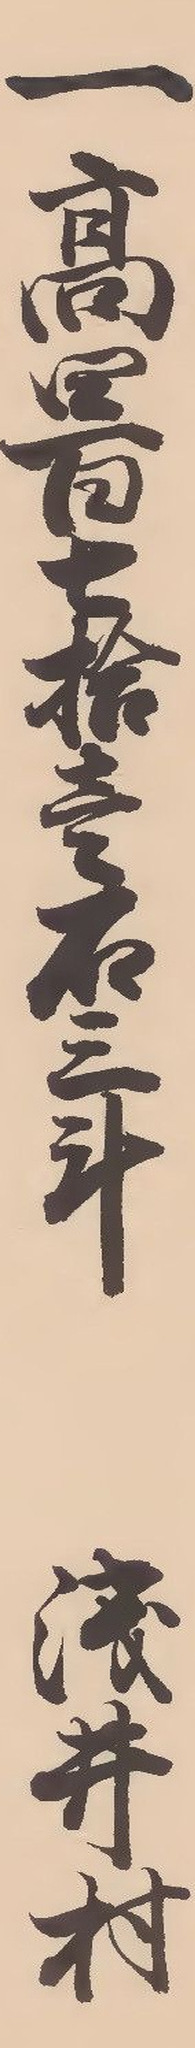一高四百七拾壱石三斗浅井村
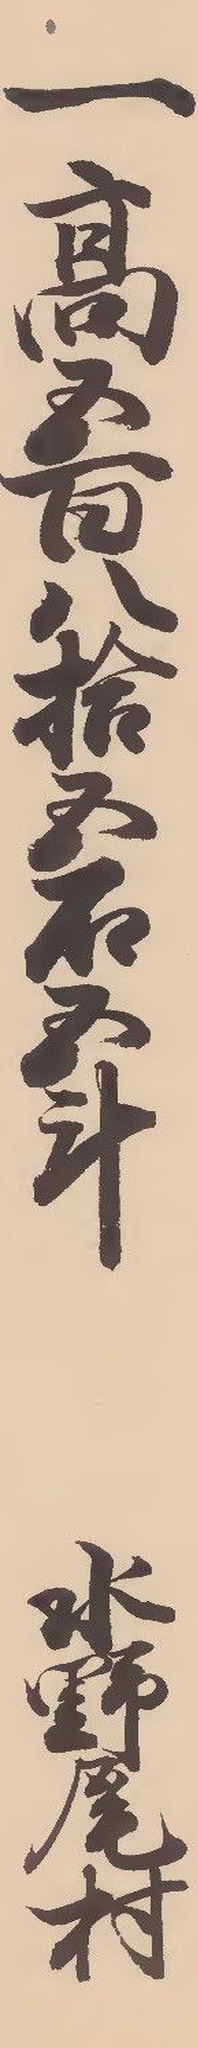一高五百八拾五石五斗水野尾村

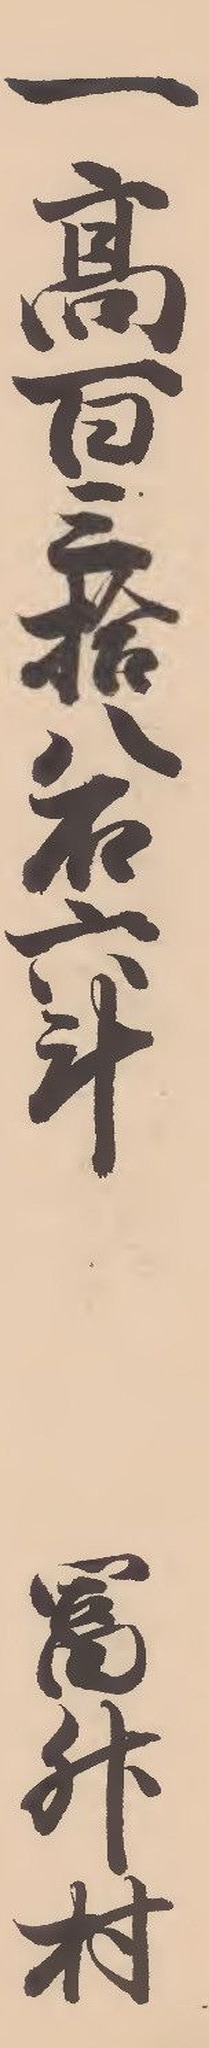一高百三拾八石六斗富升村
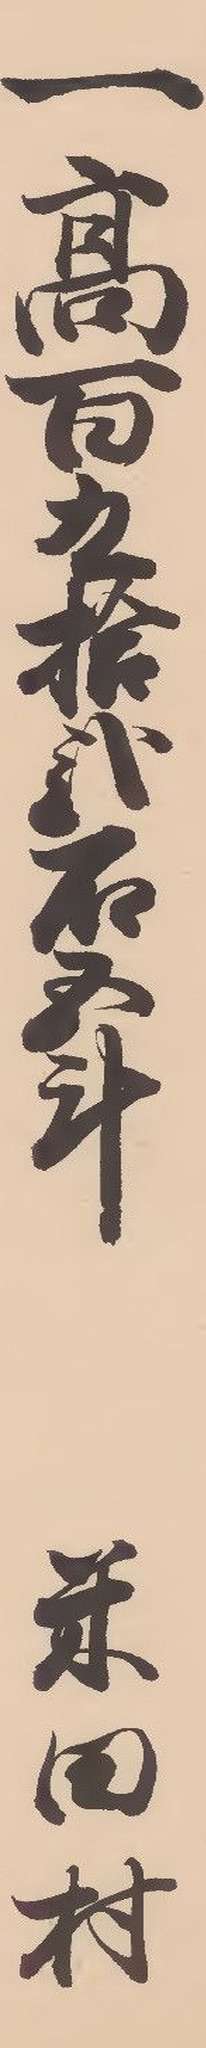一高百九拾弐石五斗米田村
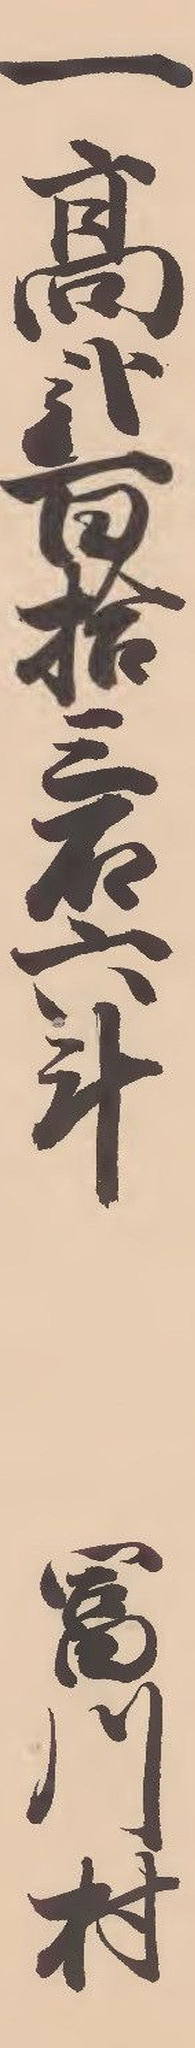一高弐百拾三石六斗富川村
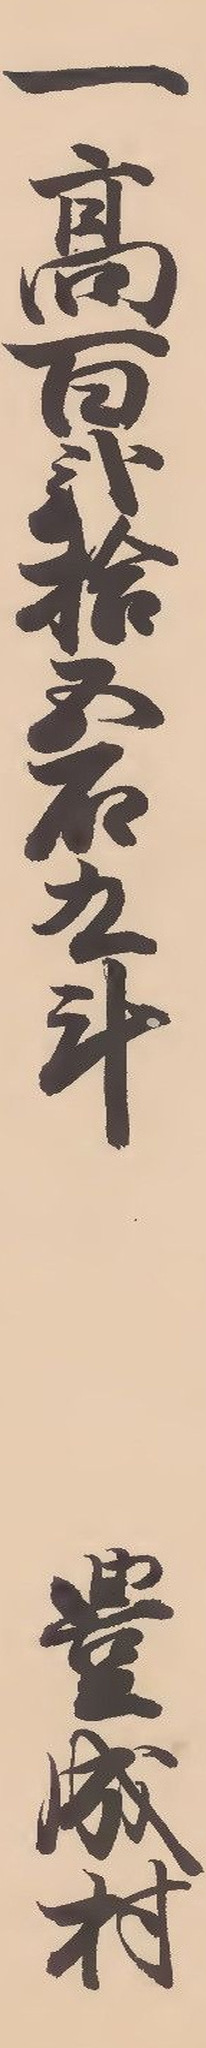一高百弐拾五石九斗豊成村
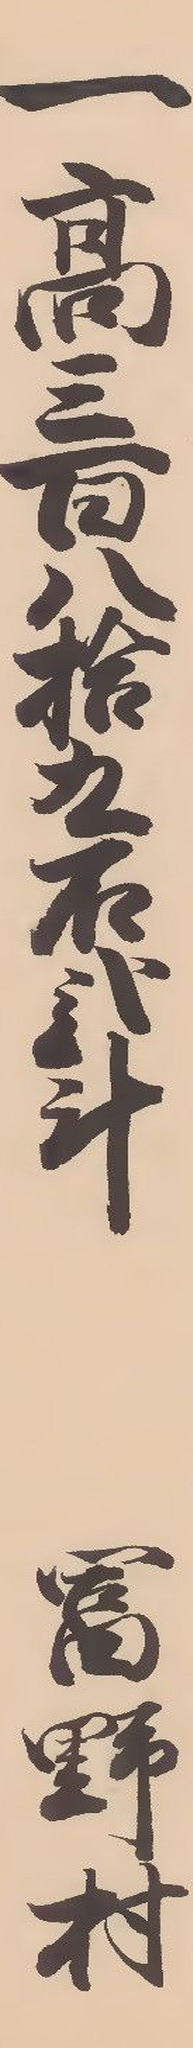一高三百八拾九石弐斗富野村
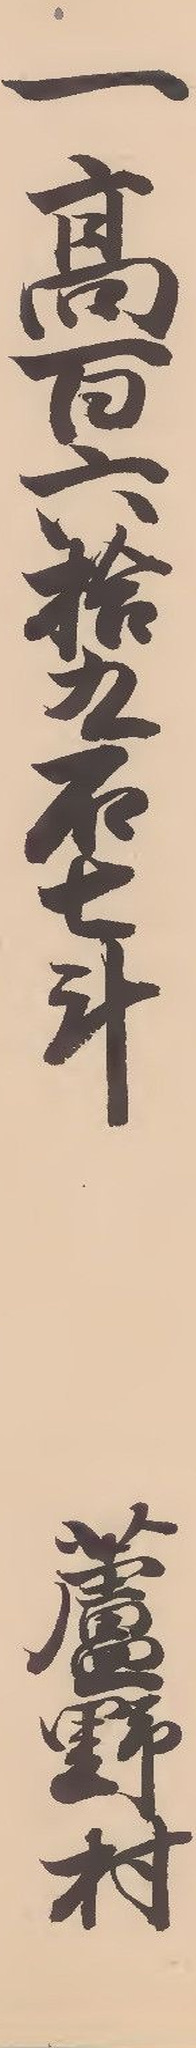一高百六拾九石七斗蘆野村
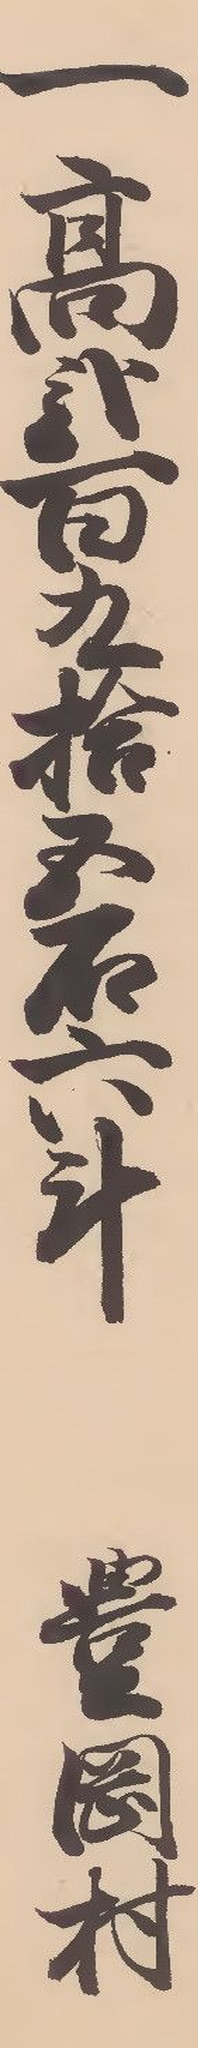一高弐百九拾五石六斗豊岡村

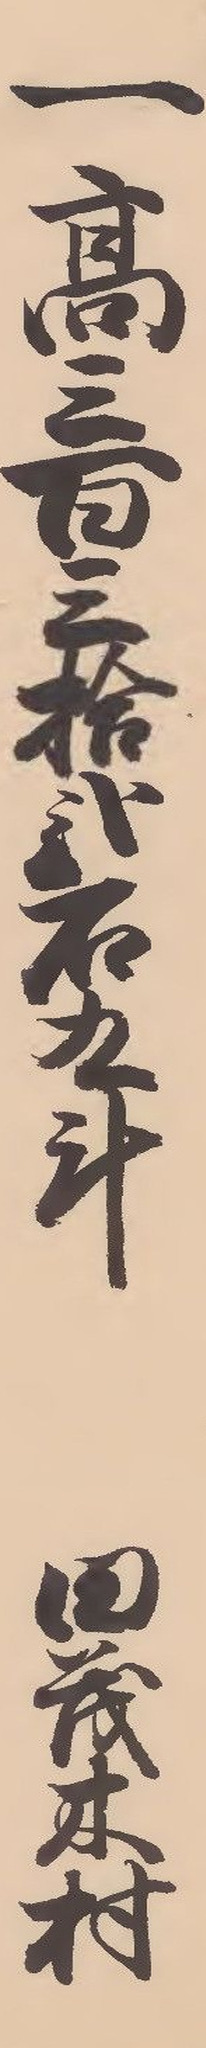一高三百三拾弐石九斗田茂木村
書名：陸奥国郷帳　７
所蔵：国立公文書館 National Archives of Japan
